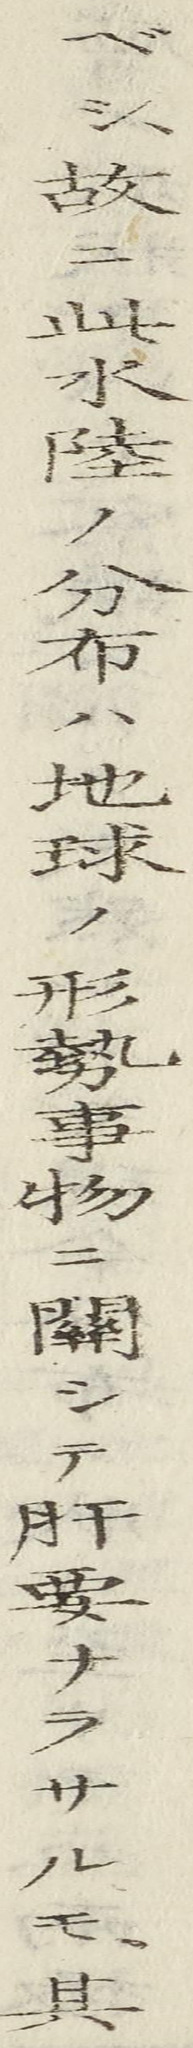ベシ、故ニ此水陸ノ分布ハ地球ノ形勢事物ニ関シテ肝要ナラサルモ、其
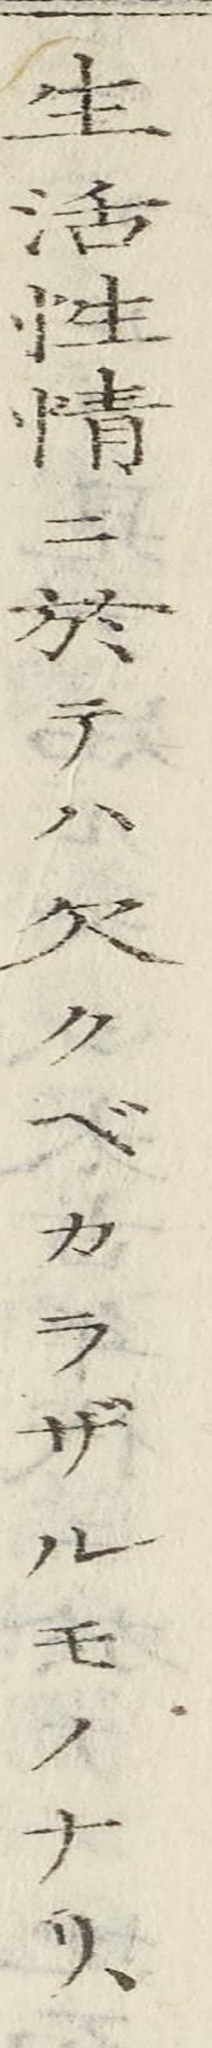生活性情ニ於テハ欠クベカラザルモノナリ、
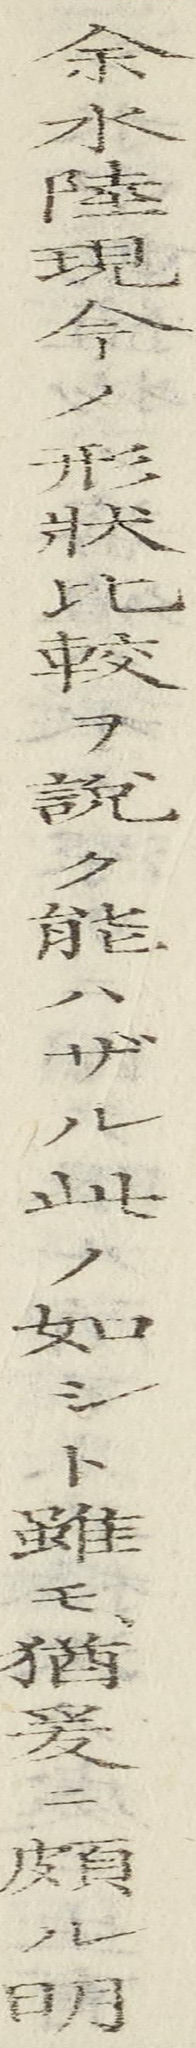余水陸現今ノ形状比較ヲ説ク能ハザル此ノ如シト雖モ、猶爰ニ頗ル明
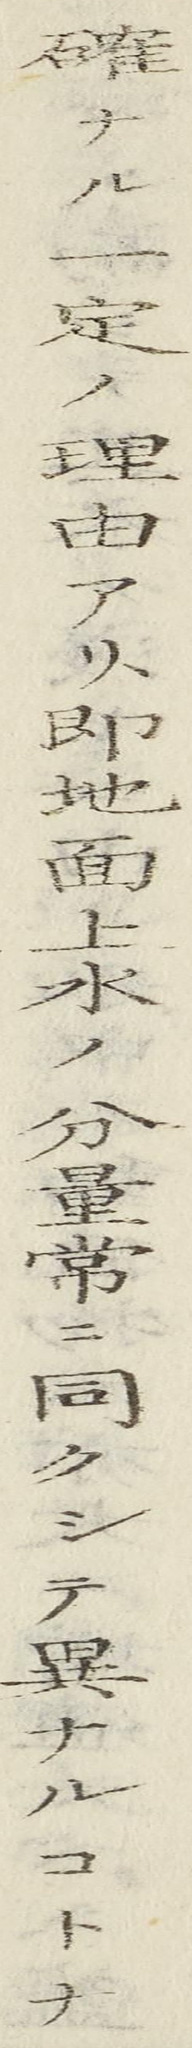確ナル一定ノ理由アリ、即地面上水ノ分量常ニ同クシテ異ナルコトナ
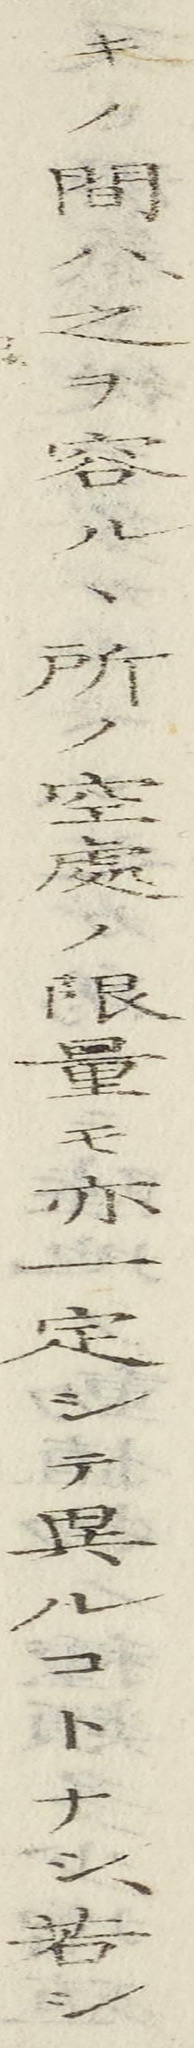キノ間ハ、之ヲ容ルヽ所ノ空処ノ限量モ亦一定シテ異ルコトナシ、若シ
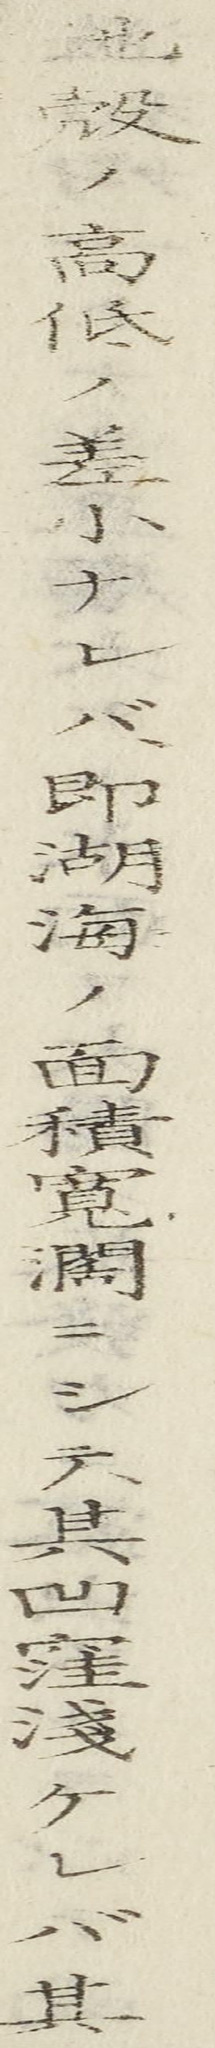地殻ノ高低ノ差小ナレバ、即湖海ノ面積寛濶ニシテ、其凹窪浅ケレバ其
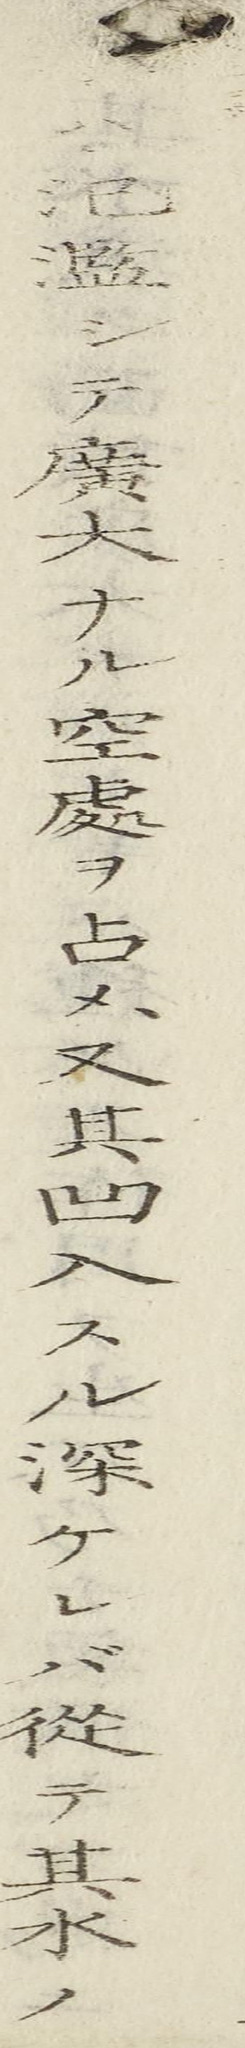トキハ氾濫シテ広大ナル空処ヲ占メ、又其凹入スル深ケレバ従テ其水ノ
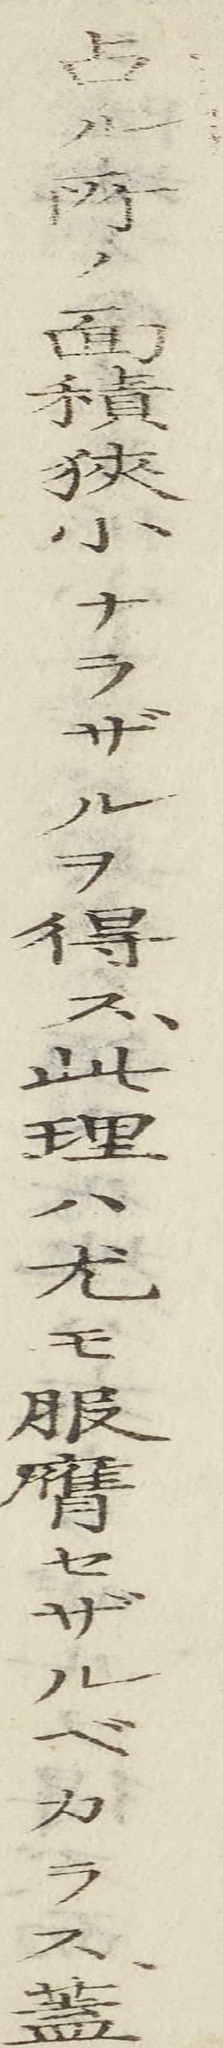占ル所ノ面積狭小ナラザルヲ得ス、此理ハ尤モ服膺セザルベカラス、蓋

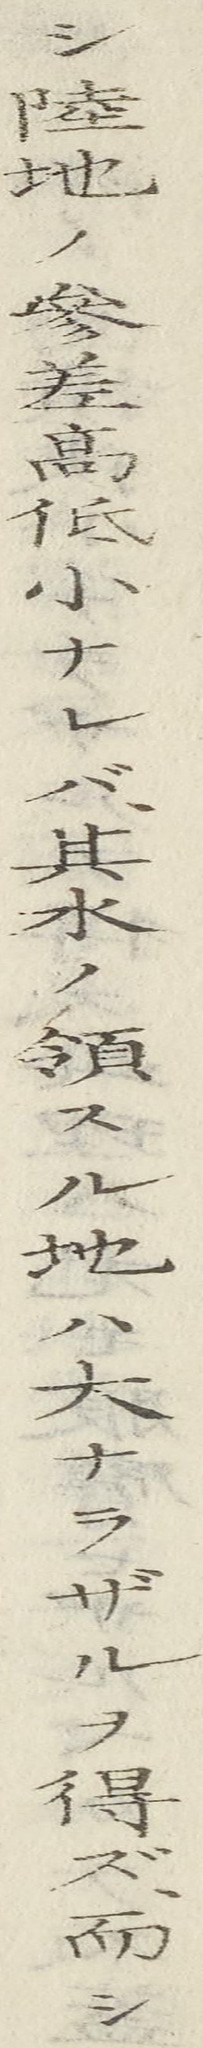シ陸地ノ参差高低小ナレバ、其水ノ領スル地ハ大ナラザルヲ得ズ、而シ
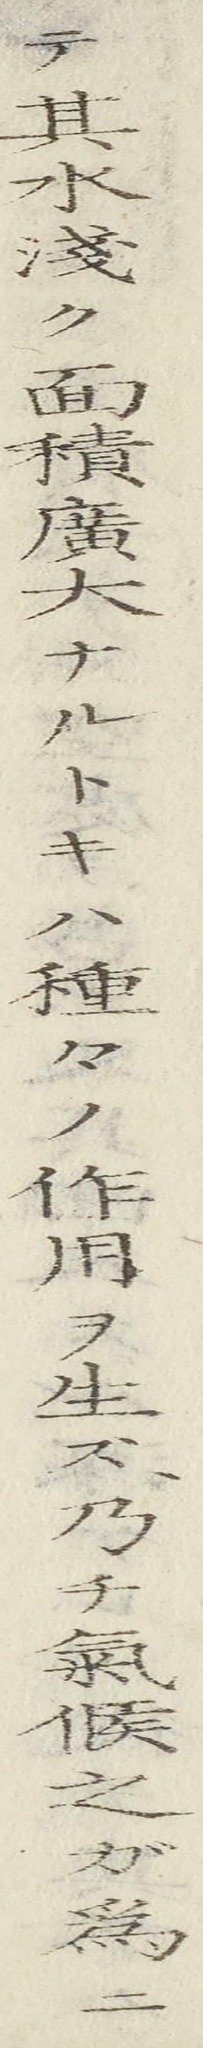テ其水浅ク面積広大ナルトキハ種々ノ作用ヲ生ズ、乃チ気候之ガ為ニ
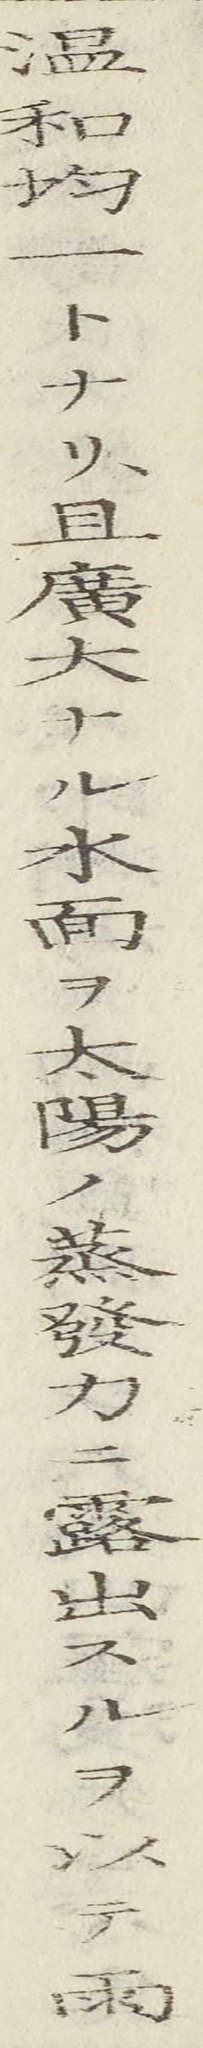温和均一トナリ、且広大ナル水面ヲ太陽ノ蒸発力ニ露出スルヲ以テ雨
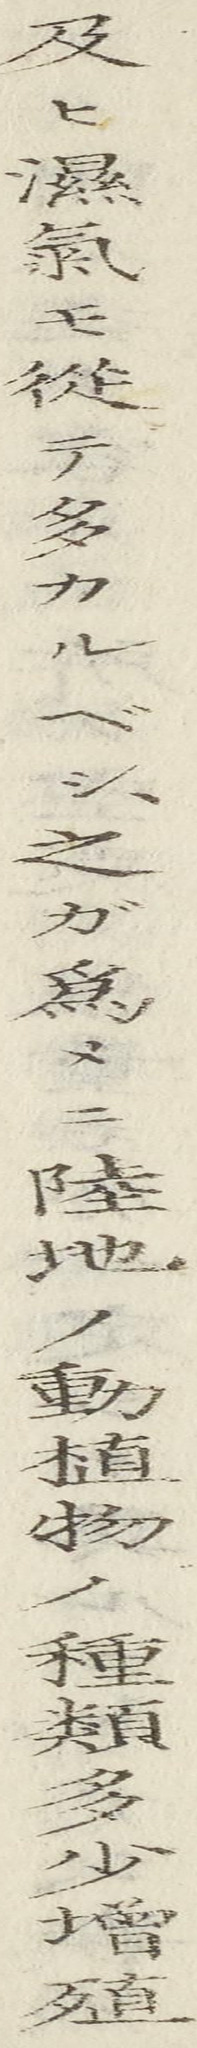及ヒ湿気モ従テ多カルベシ、之ガ為メニ陸地ノ動植物ノ種類多少増殖
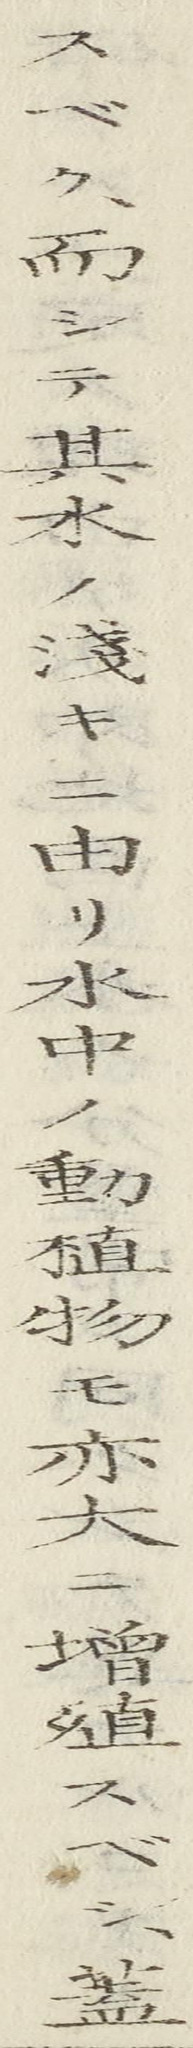スベク、而シテ其水ノ浅キニ由リ水中ノ動植物モ亦大ニ増殖スベシ、蓋
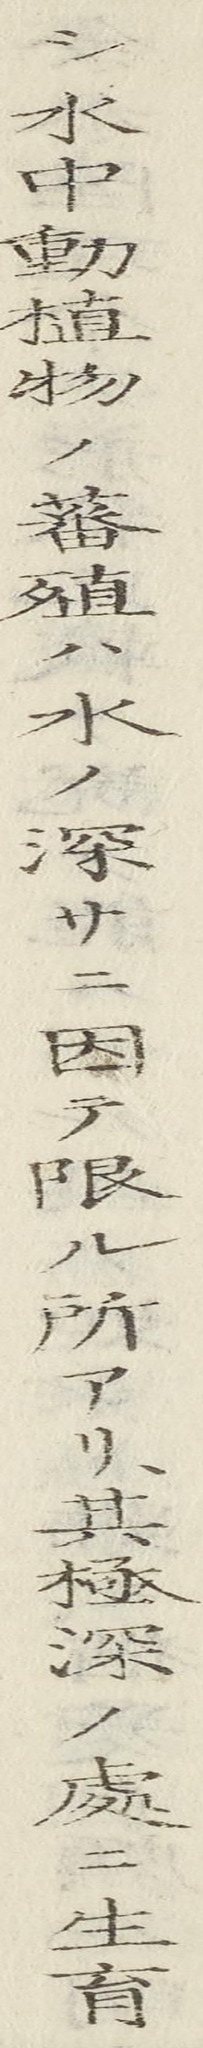シ水中動植物ノ蕃殖ハ水ノ深サニ因テ限ル所アリ、其極深ノ処ニ生育
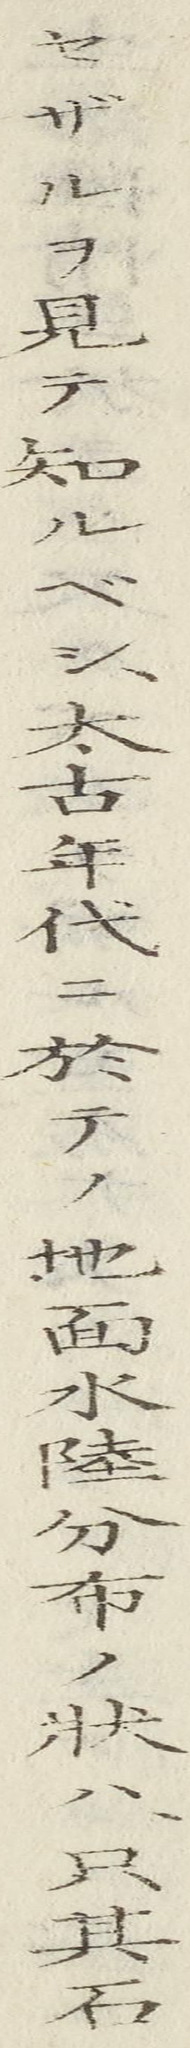セザルヲ見テ知ルベシ、太古年代ニ於テノ地面水陸分布ノ状ハ、只其石
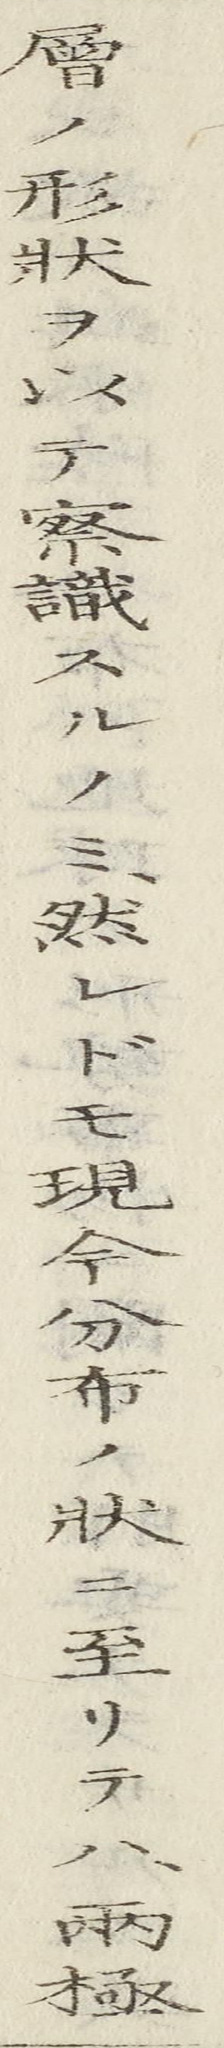層ノ形状ヲ以テ察識スルノミ、然レドモ現今分布ノ状ニ至リテハ、両極
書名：百科全書　地文學　全
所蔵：東京大学地震研究所図書室 Earthquake Research Institute Library, The University of Tokyo, JAPAN
